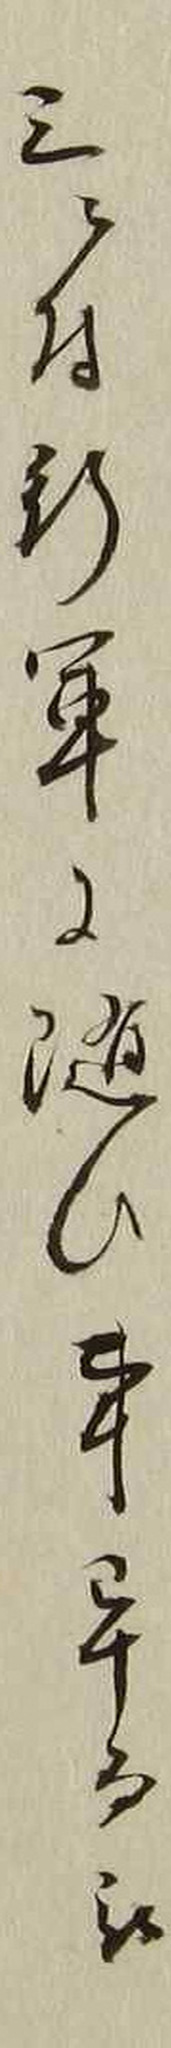三ニ付行軍ニ随ひ事畢而被
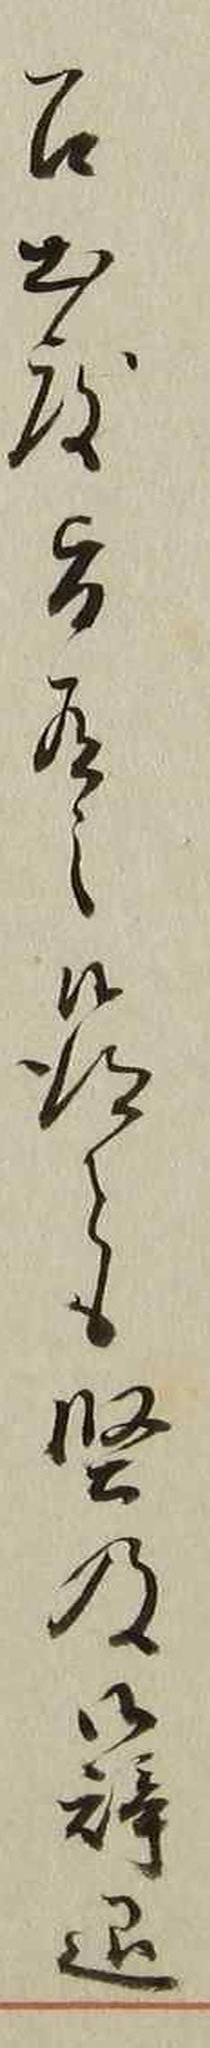召出度旨有之候得とも堅及御辞退
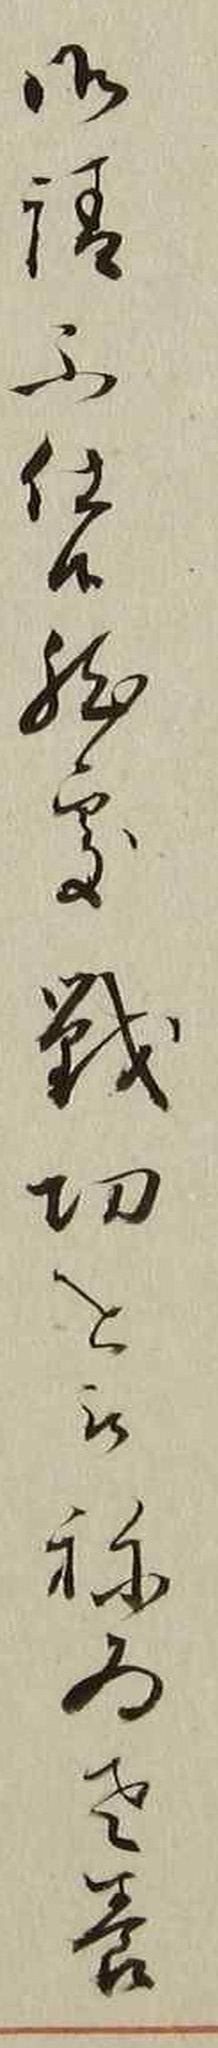御請不仕候然処戦功を被称為左養
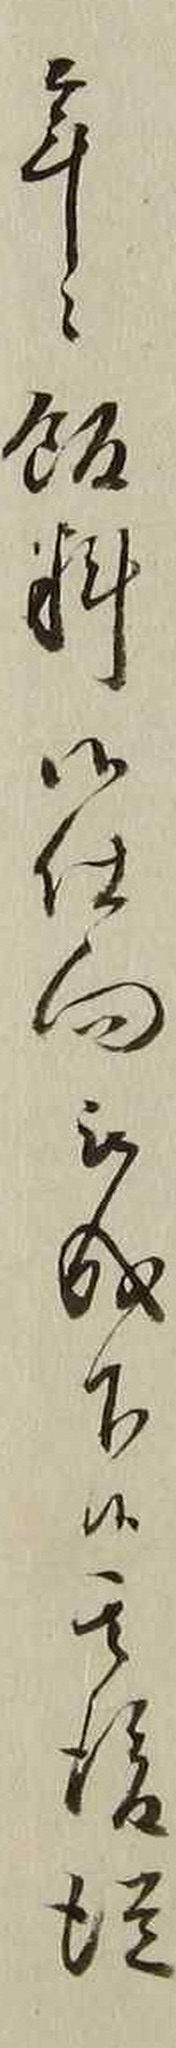年々飯料御仕向被成下候其後従
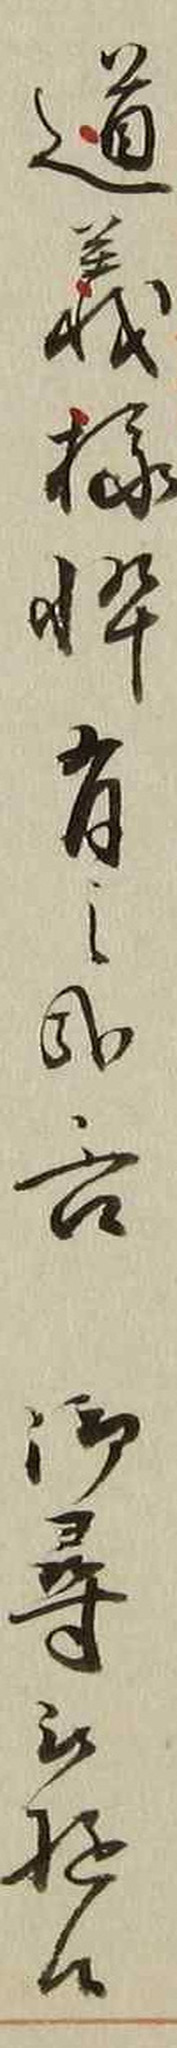道義様忰有之哉否御尋被遊候
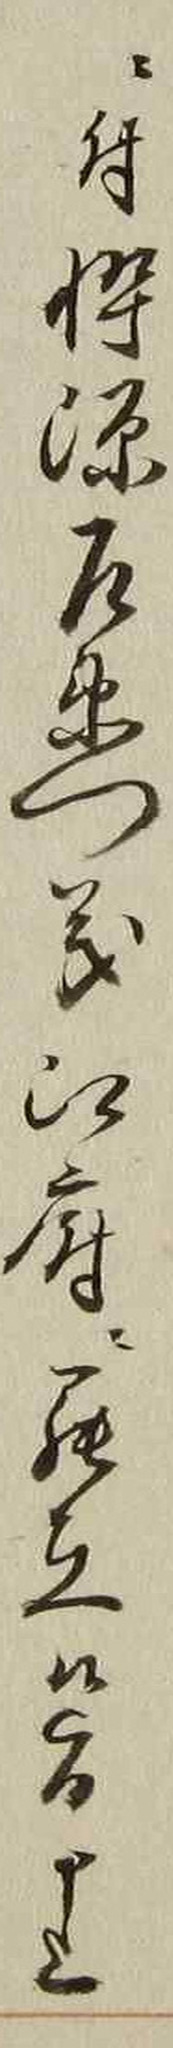ニ付忰源左衛門義江府ニ罷有候旨申上
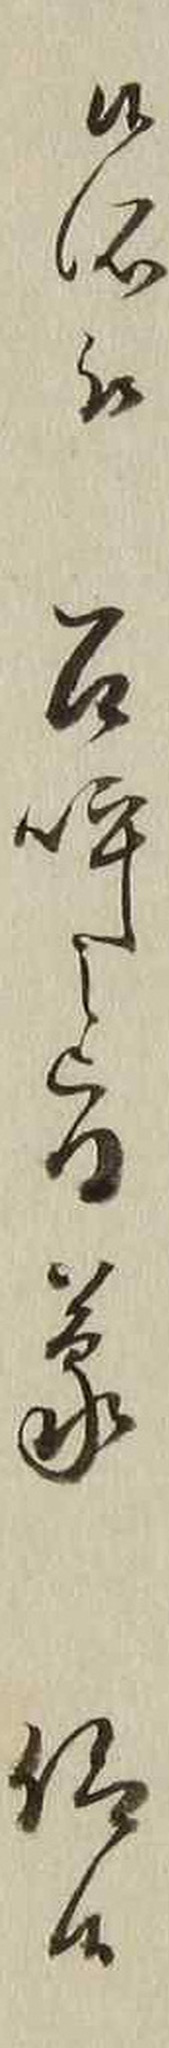候所被召呼之旨蒙仰候
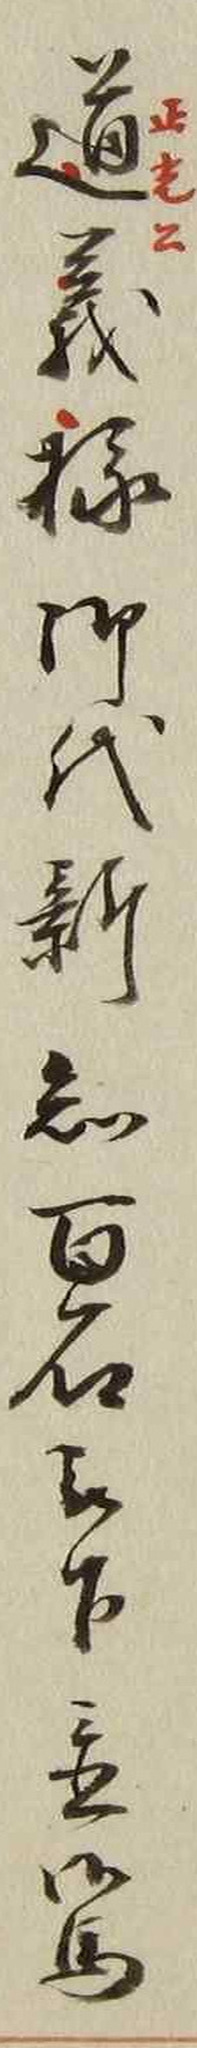道義様御代新知百石被下置御馬
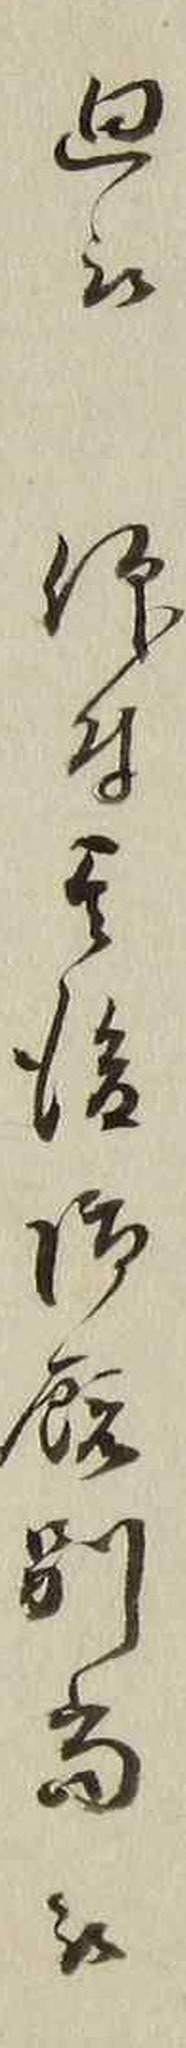廻被仰付其後御厩別当被
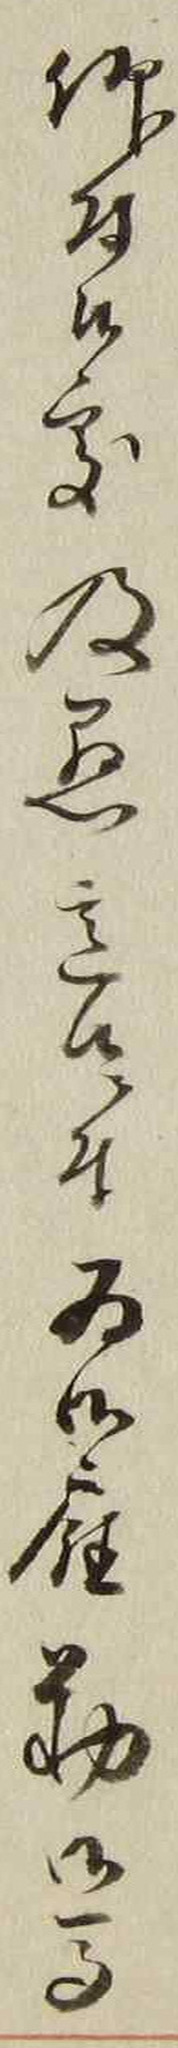仰付候処及愚意候ニ付為御雇勤御馬
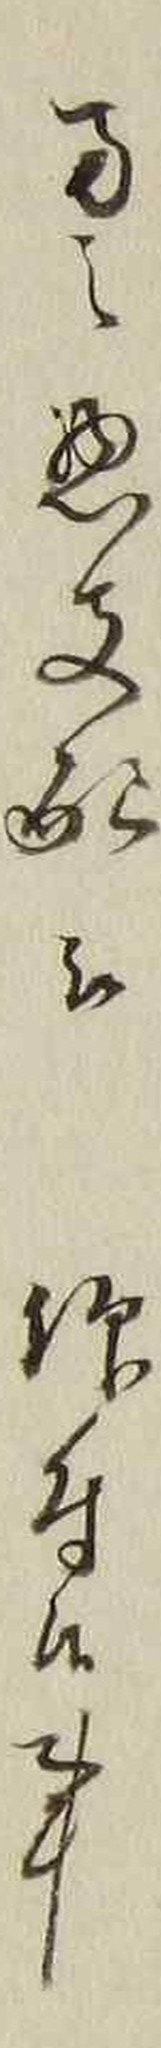方之惣支配被仰付候事
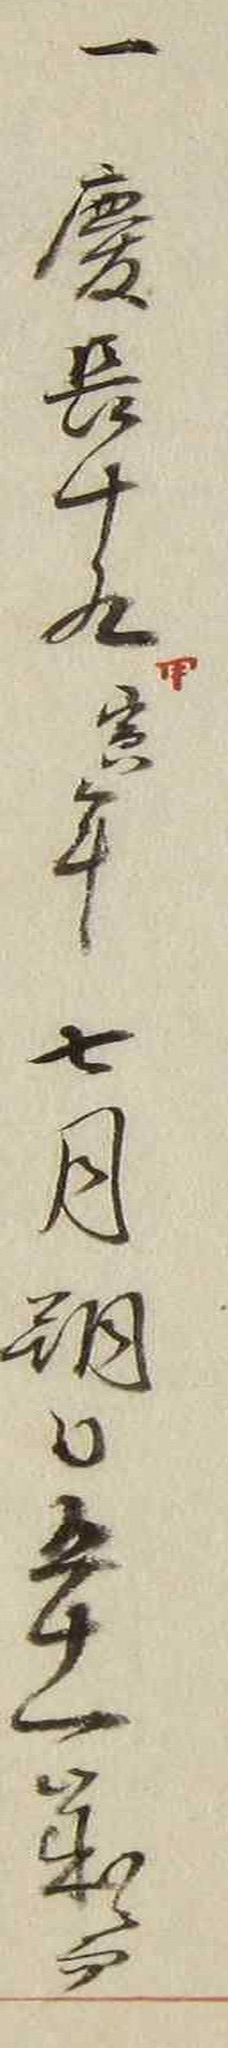一慶長十九寅年七月朔日五十一歳ニ而
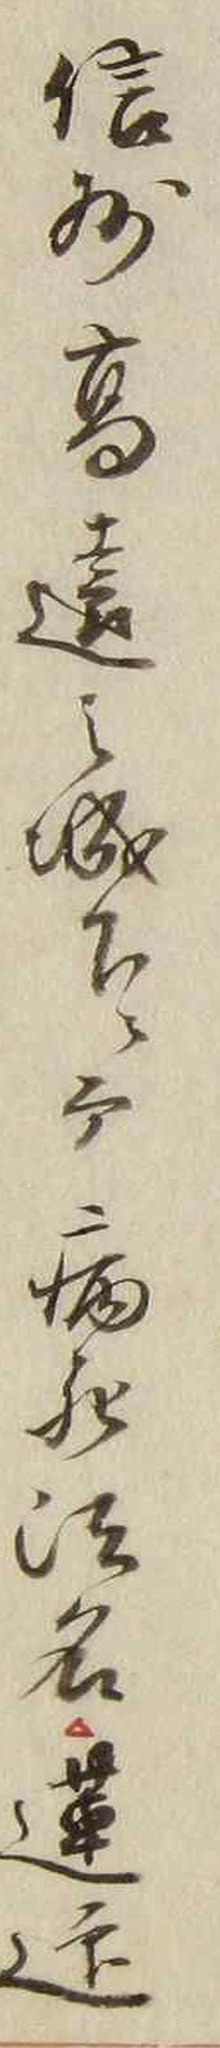信州高遠之城下ニ而病死法名蓮遷
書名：諸士系譜　巻之204　や之部1
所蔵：会津若松市立会津図書館
